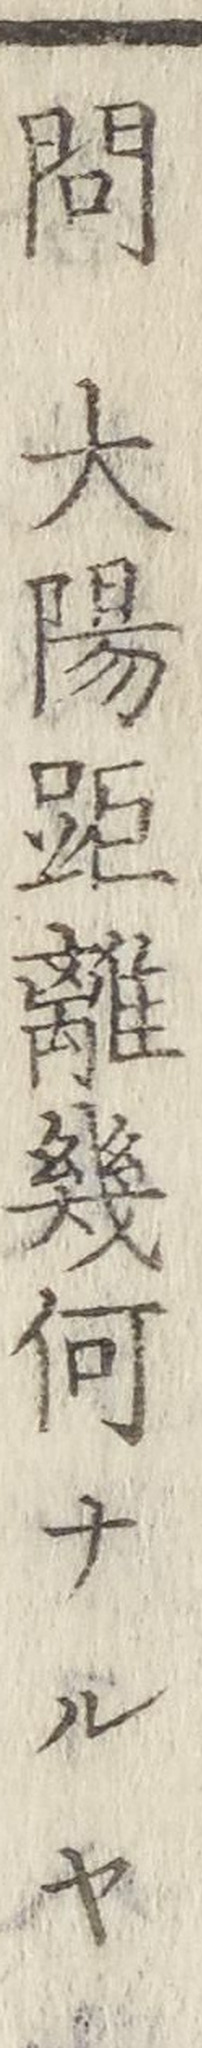問大陽距離幾何ナルヤ
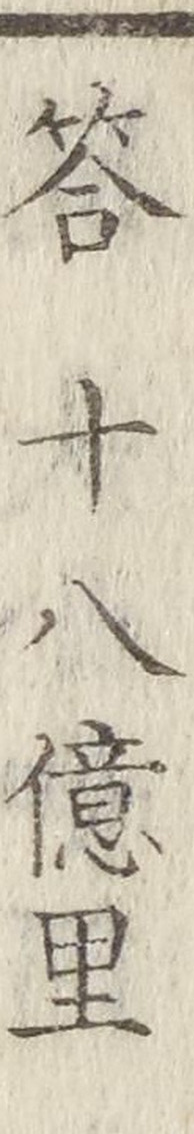答十八億里
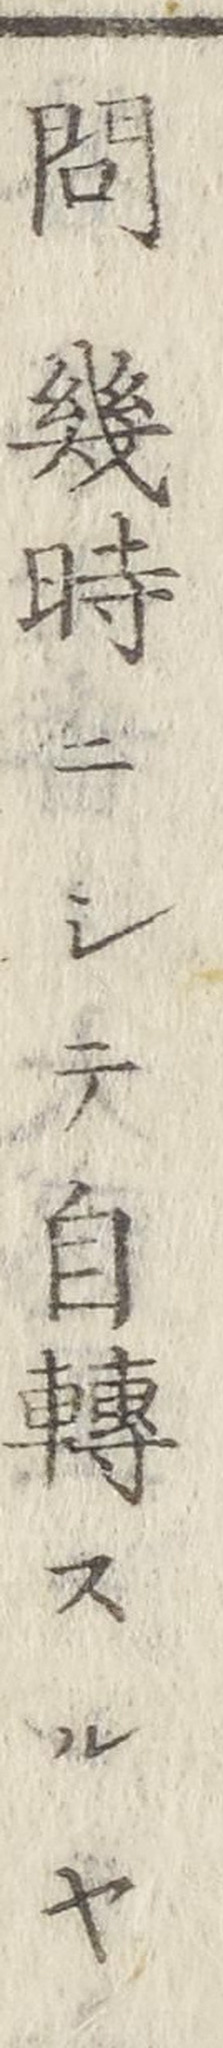問幾時ニシテ自転スルヤ
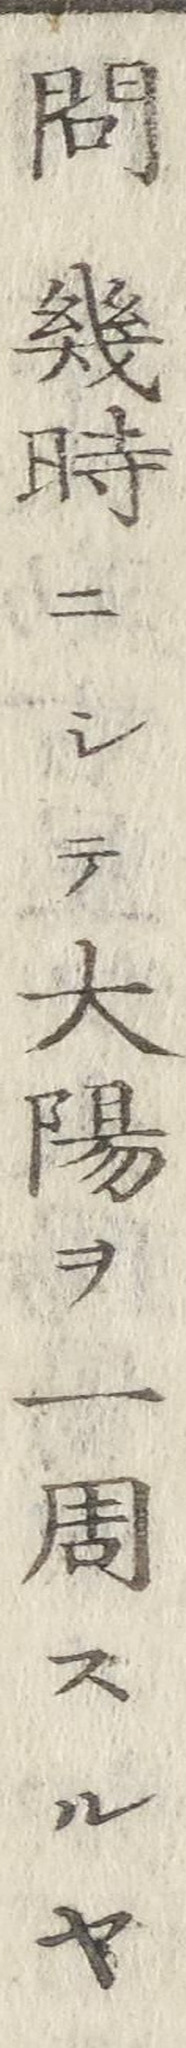問幾時ニシテ大陽ヲ一周スルヤ
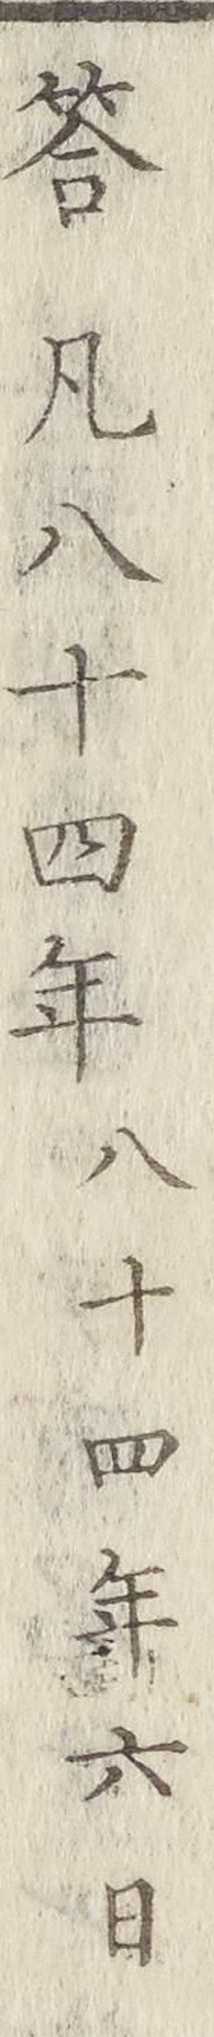答凡八十四年八十四年六日
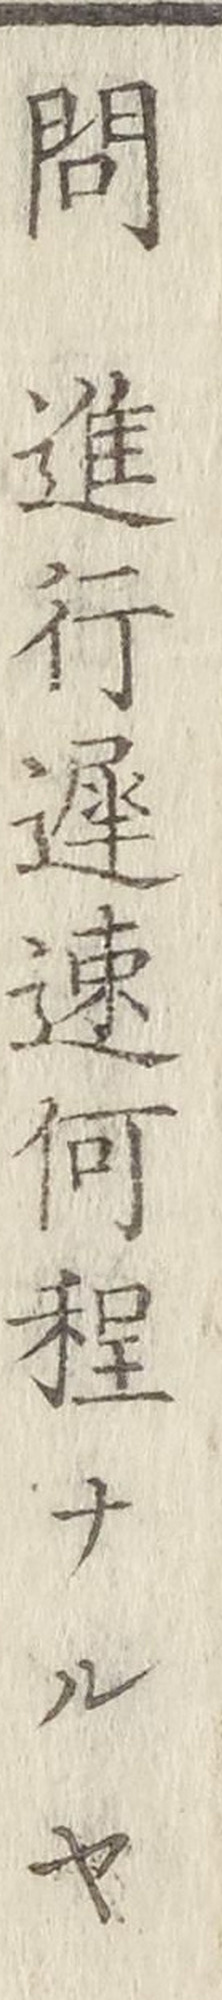問進行遅速何程ナルヤ
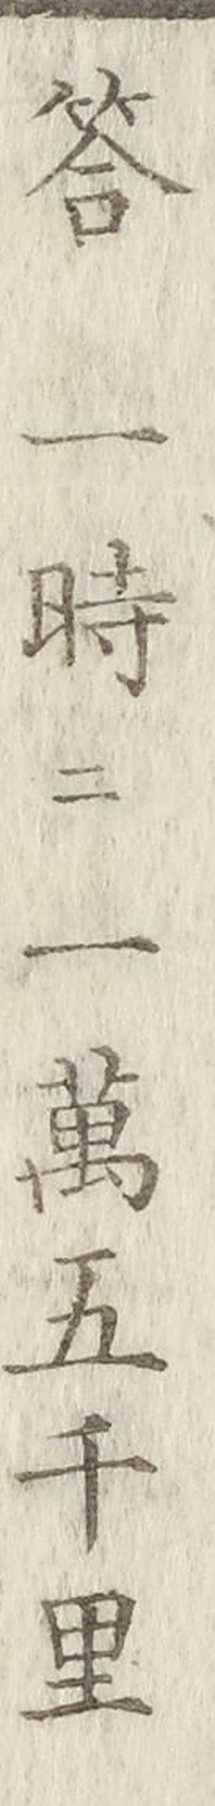答一時ニ一万五千里
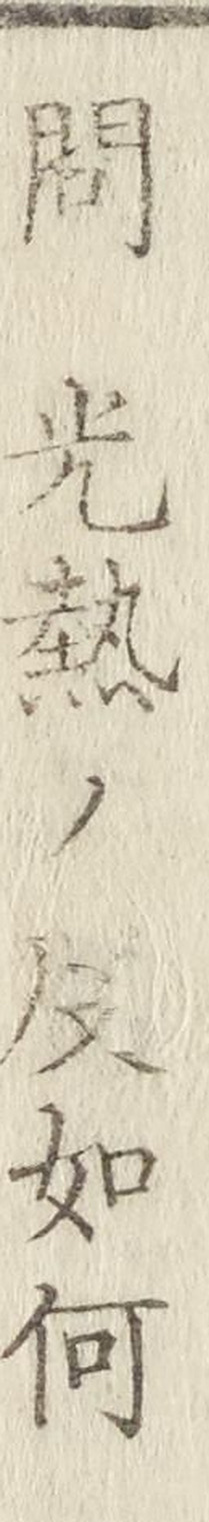問光熱ノ度如何
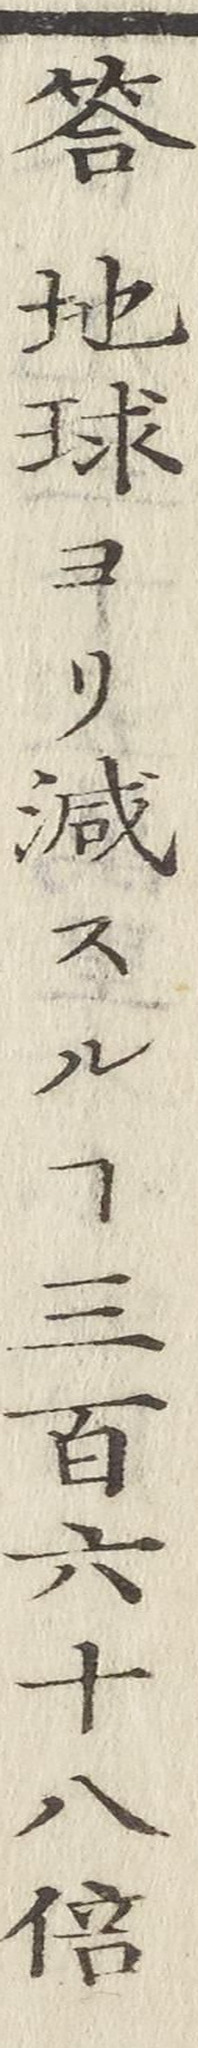答地球ヨリ減スルコト三百六十八倍
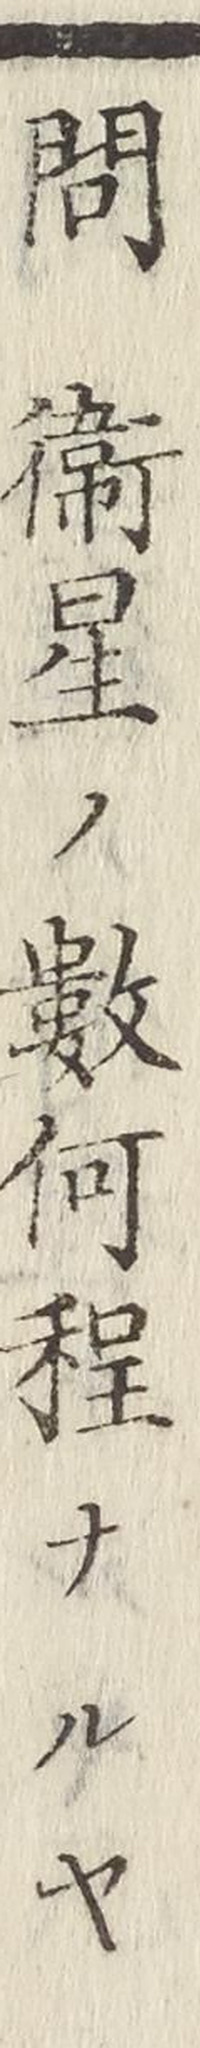問衛星ノ数何程ナルヤ
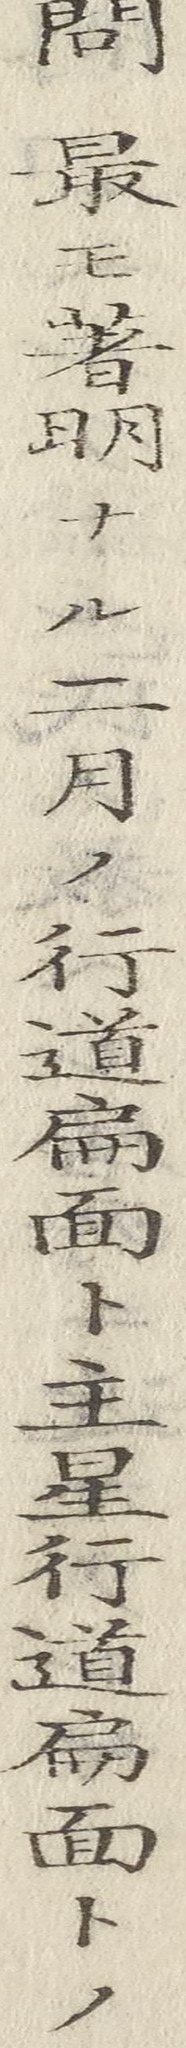問最モ著明ナル二月ノ行道扁面ト主星行道扁面トノ
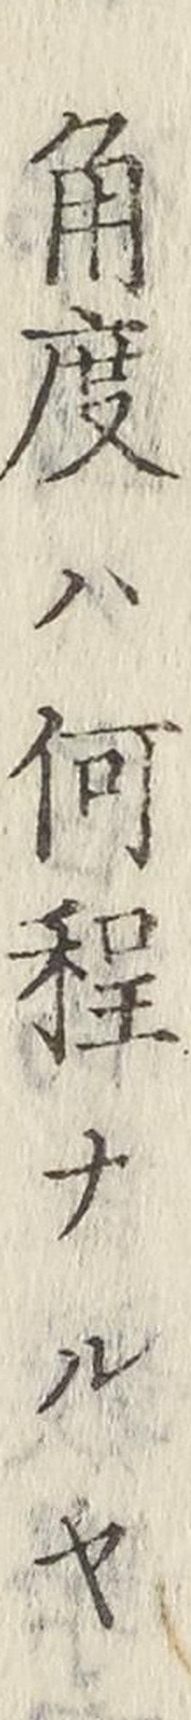角度ハ何程ナルヤ
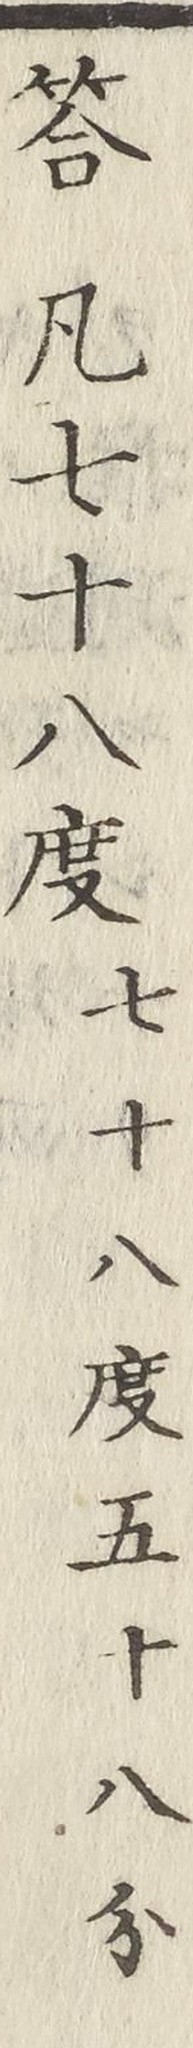答凡七十八度七十八度五十八分
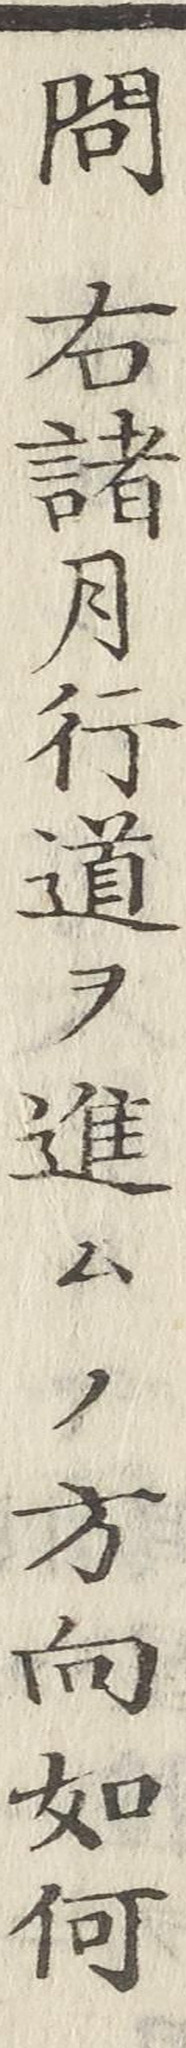問右諸月行道ヲ進ムノ方向如何
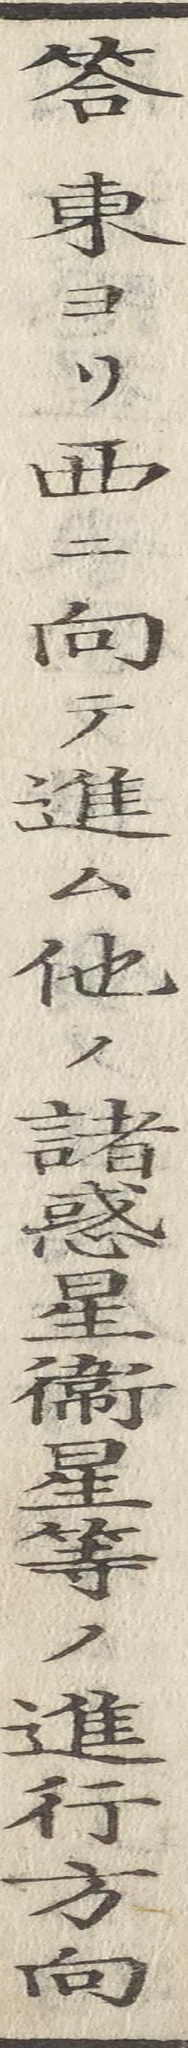答東ヨリ西ニ向テ進ム他ノ諸惑星衞星等ノ進行方向
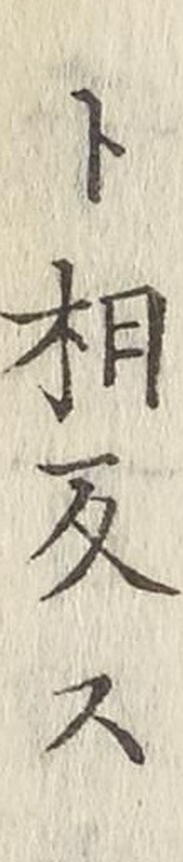ト相反ス
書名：星学圖説　下
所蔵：東京大学地震研究所図書室 Earthquake Research Institute Library, The University of Tokyo, JAPAN
